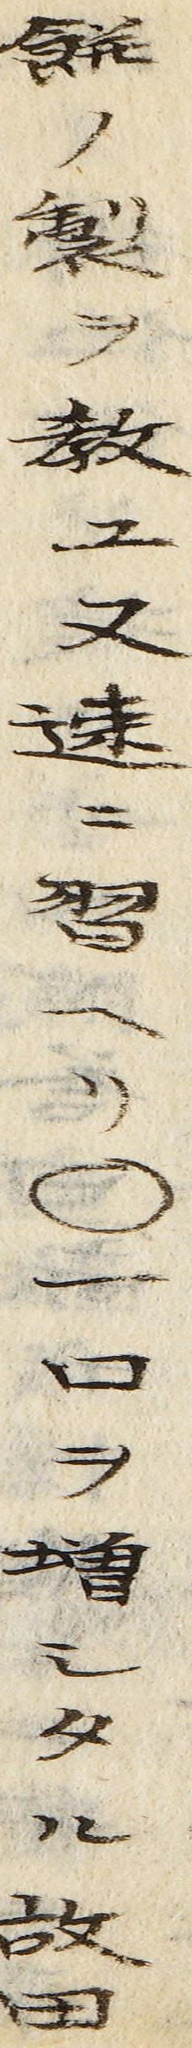餅ノ製ヲ教ユ又速ニ習ヘリ◯一口ヲ増シタル故田
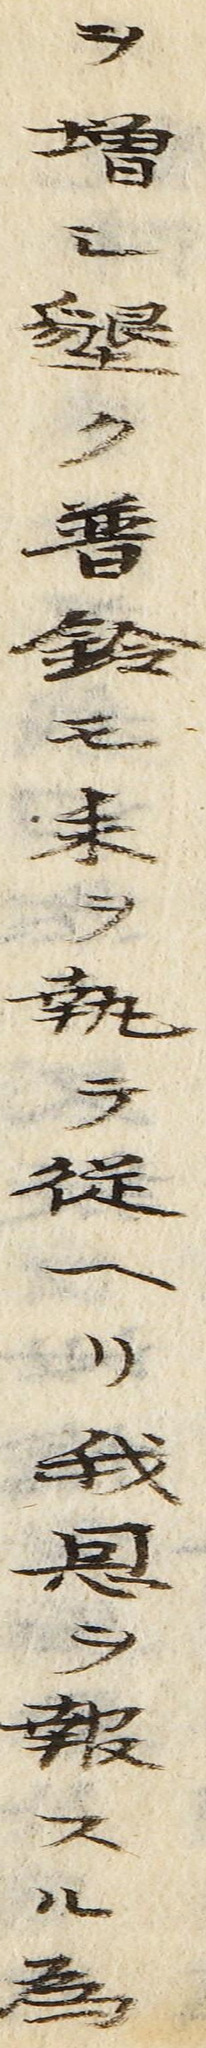ヲ増シ墾ク普鈴モ耒ヲ執テ従ヘリ我恩ヲ報スル為
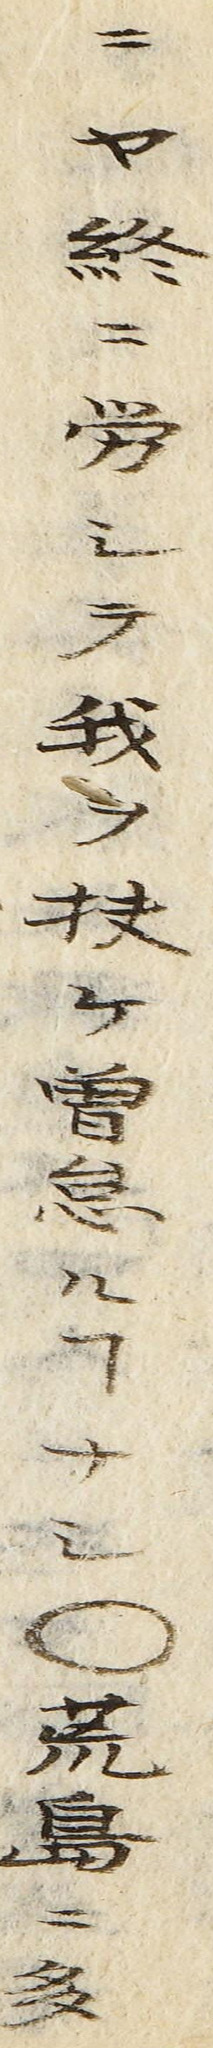ニヤ終ニ労シテ我ヲ扶ケ曽怠ルコトナシ◯荒島ニ多
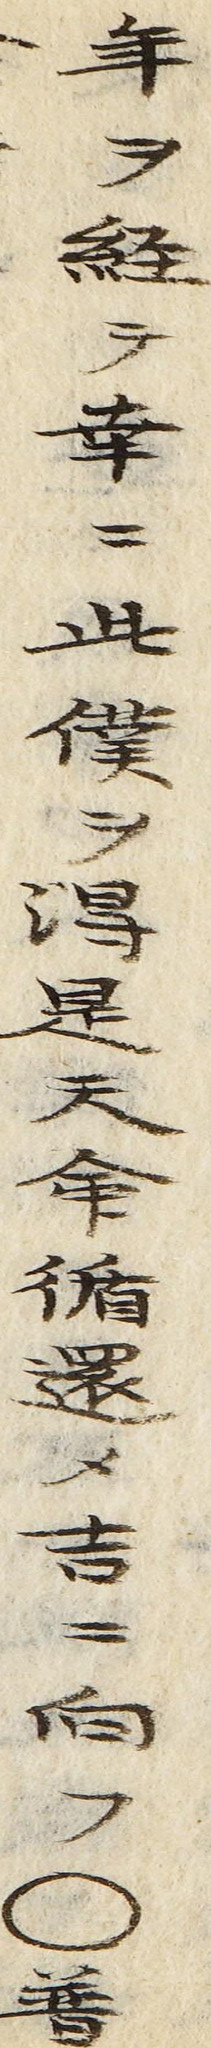年ヲ経テ幸ニ此僕ヲ得是天命循還シテ吉ニ向フ◯普
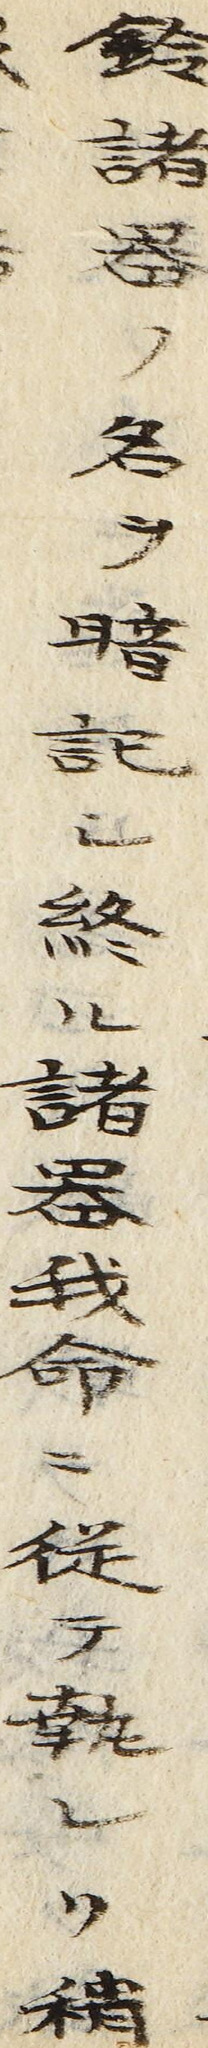鈴諸器ノ名ヲ暗記シ終ル諸器我命ニ従テ執レリ稍
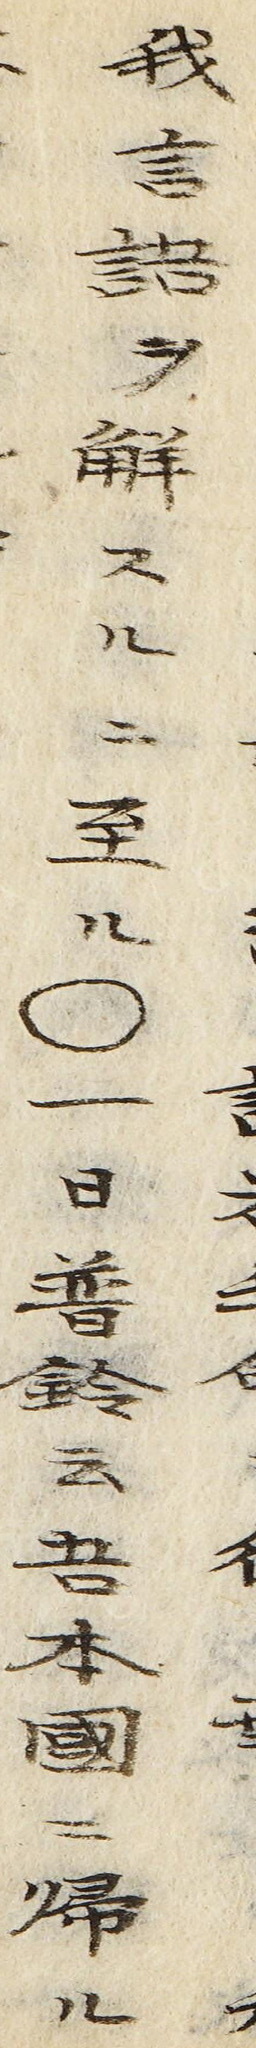我言語ヲ解スルニ至ル◯一日普鈴云吾本国ニ帰ル
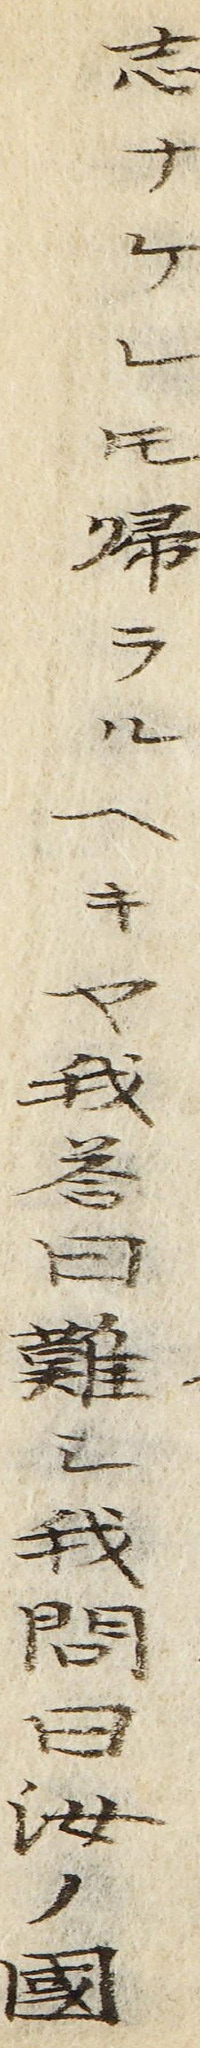志ナケレトモ帰ラルヘキヤ我答曰難シ我問曰汝ノ国

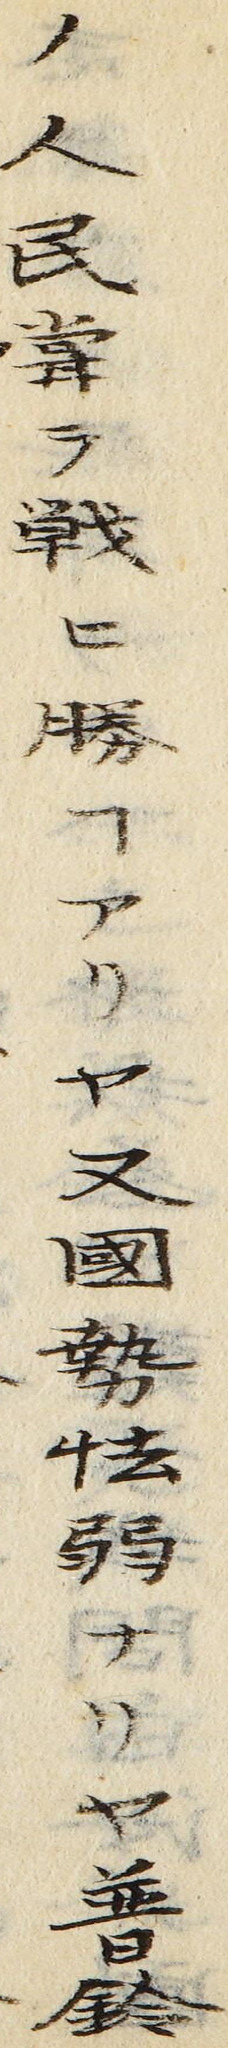ノ人民嘗テ戦ヒ勝コトアリヤ又国勢怯弱ナリヤ普鈴
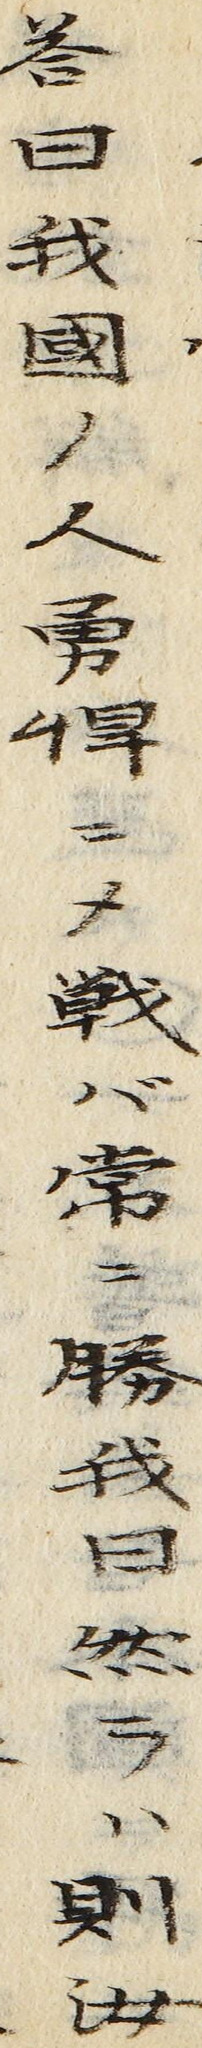答曰我国ノ人勇悍ニシテ戦バ常ニ勝我曰然ラバ則汝
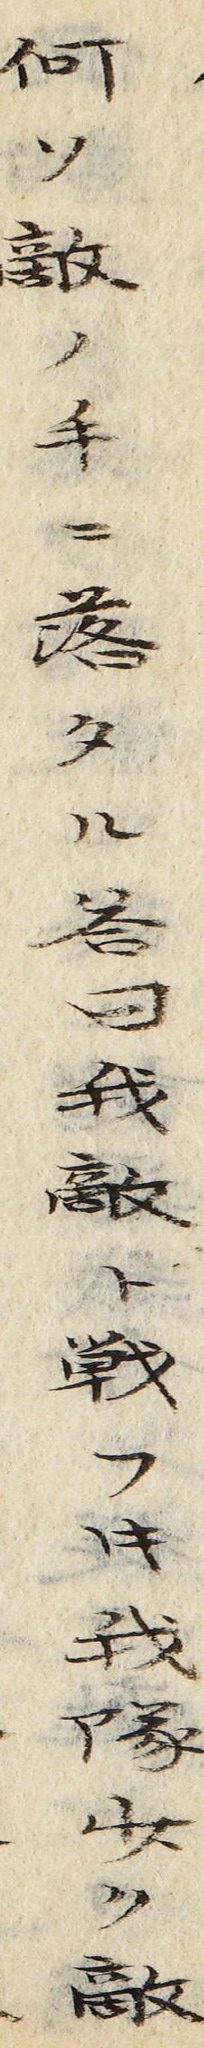何ソ敵ノ手ニ落タル答曰我敵ト戦フトキ我隊少ク敵
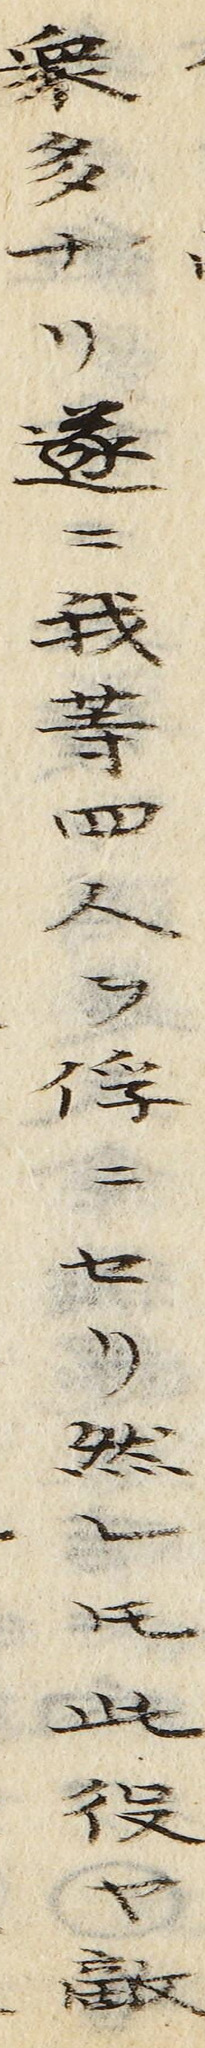衆多ナリ遂ニ我等四人ヲ俘ニセリ然レトモ此役ヤ敵
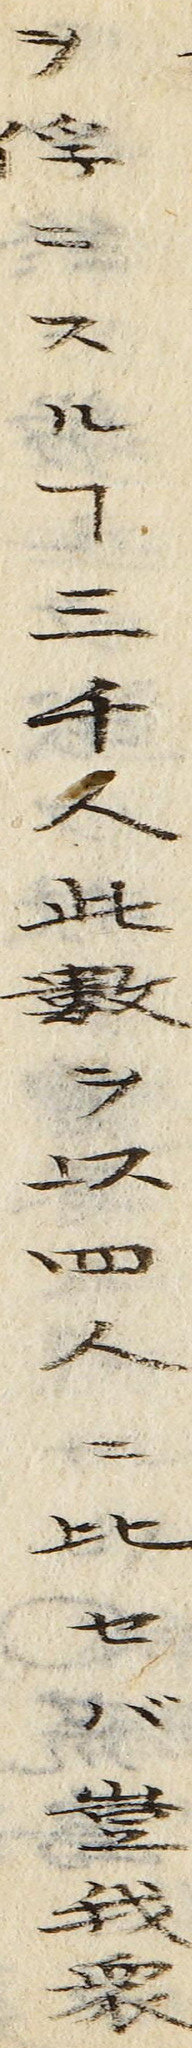ヲ俘ニスルコト三千人此数ヲ以四人ニ比セバ豈我衆
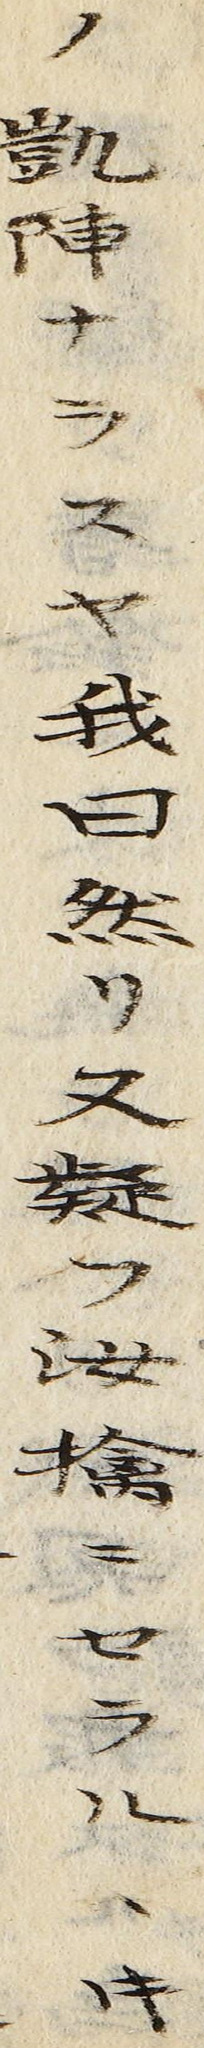ノ凱陣ナラスヤ我曰然リ又疑フ汝擒ニセラルヽトキ
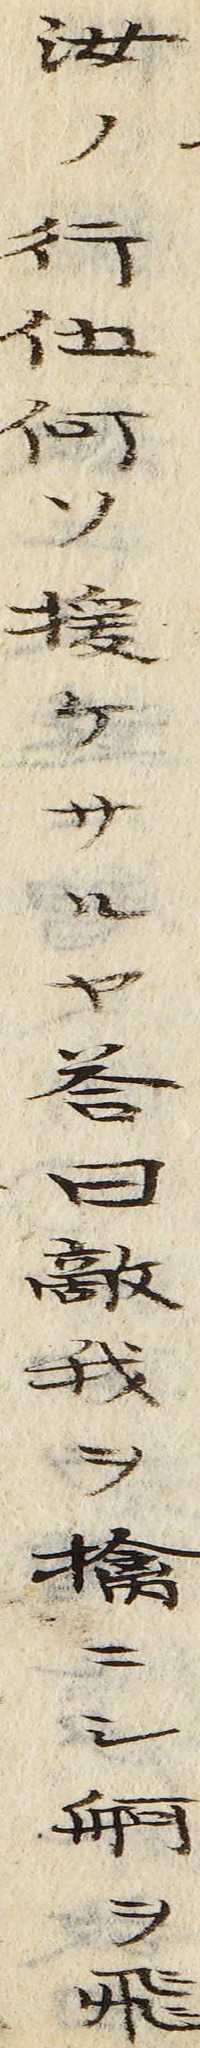汝ノ行伍何ソ援ケサルヤ答曰敵我ヲ擒ニシ舸ヲ飛
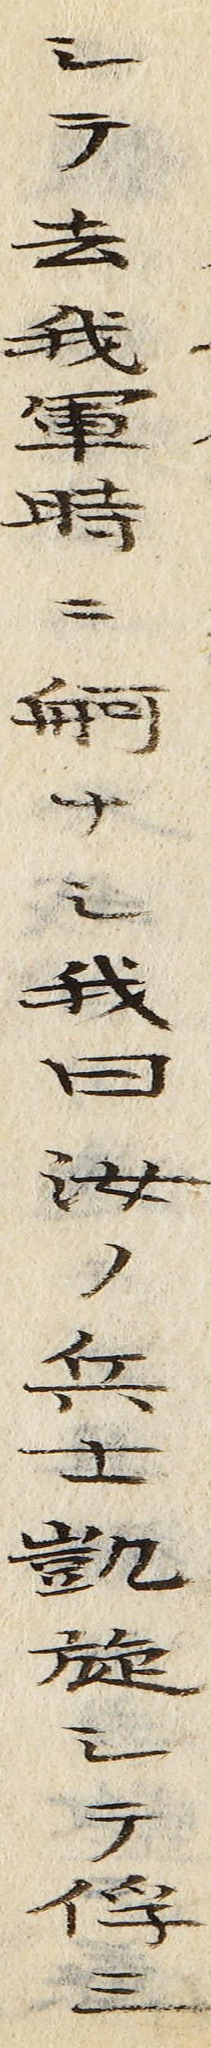シテ去我軍時ニ舸ナシ我曰汝ノ兵士凱旋シテ俘三
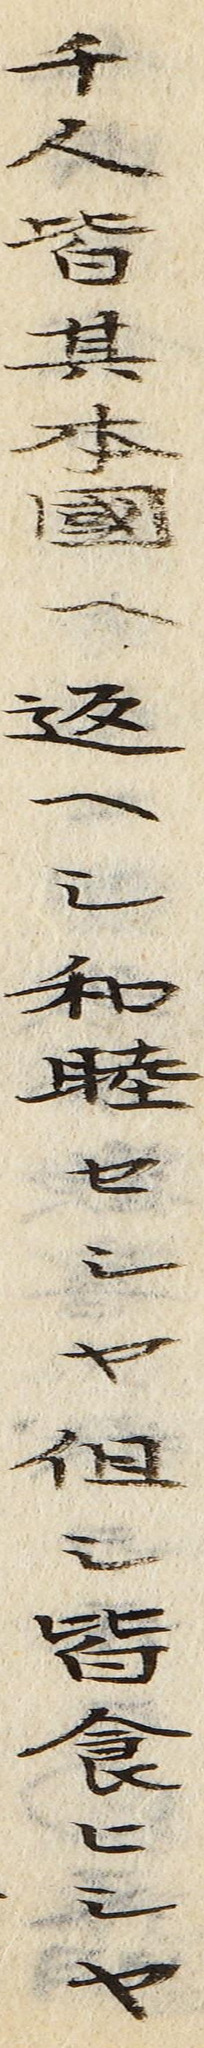千人皆其本国ヘ返ヘシ和睦セシヤ但シ皆食ヒシヤ
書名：漂流紀事
